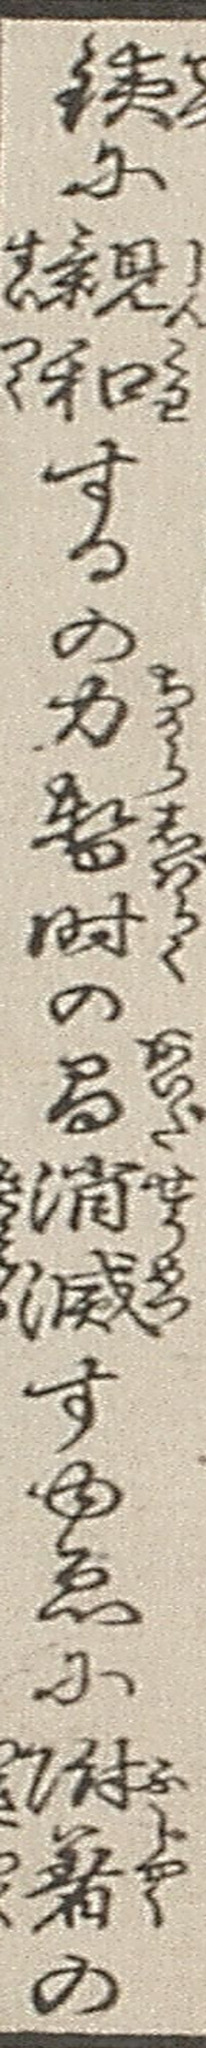鉄に親和するの力暫時の間消滅すゆゑに附着の
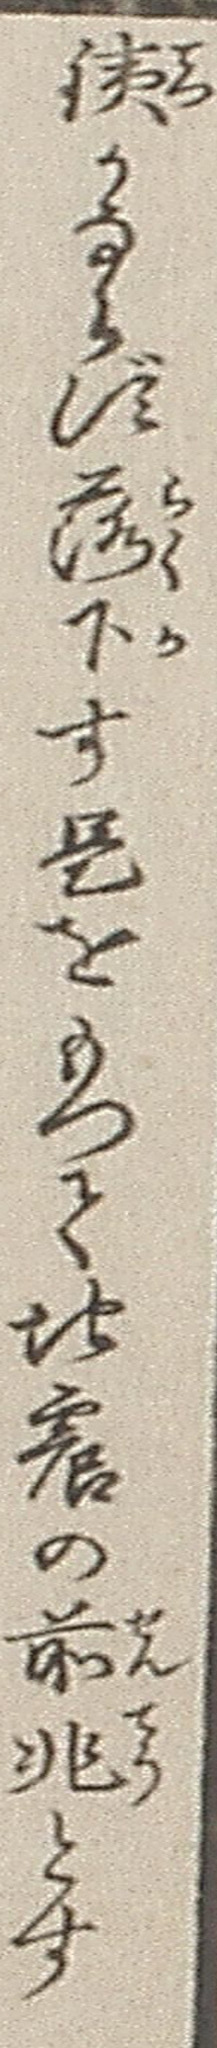鉄かならず落下す是をもつて地震の前兆とす
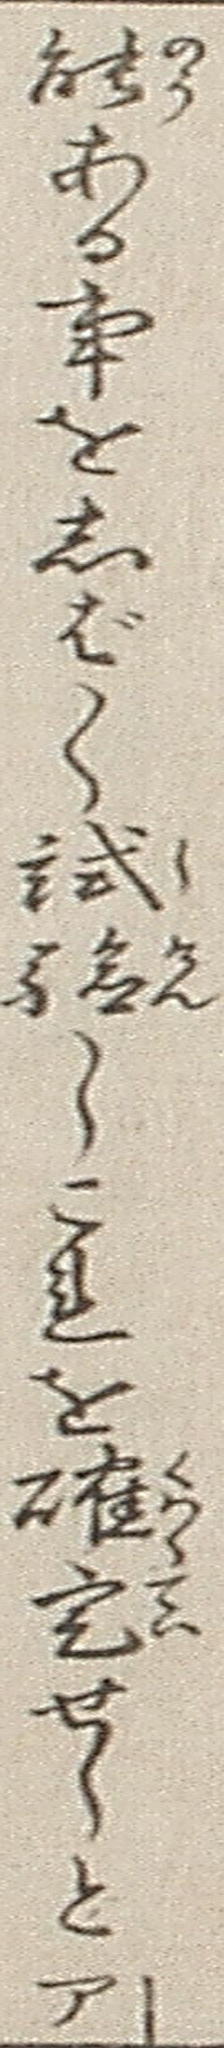能ある事をしば〳〵試験しこれを確定せしとア
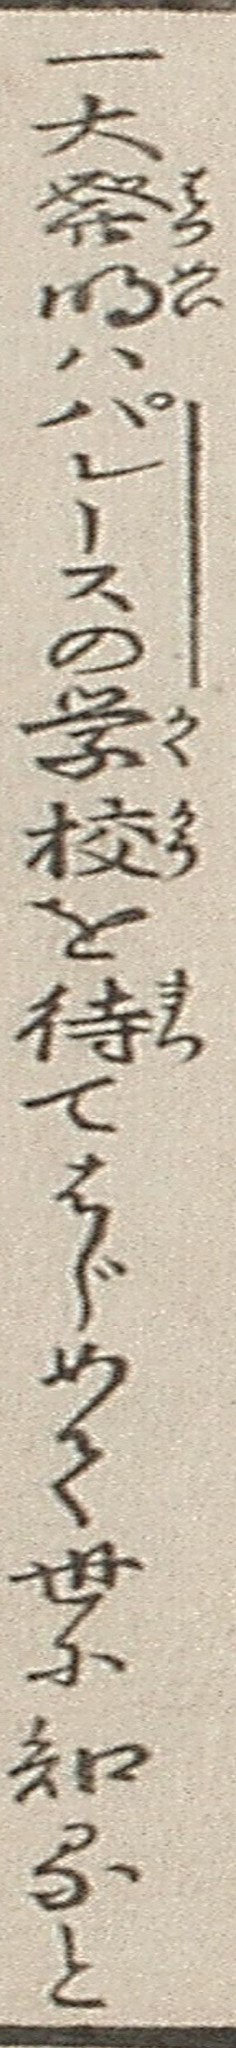一大発明はパレースの学校を待てはじめて世に知ると

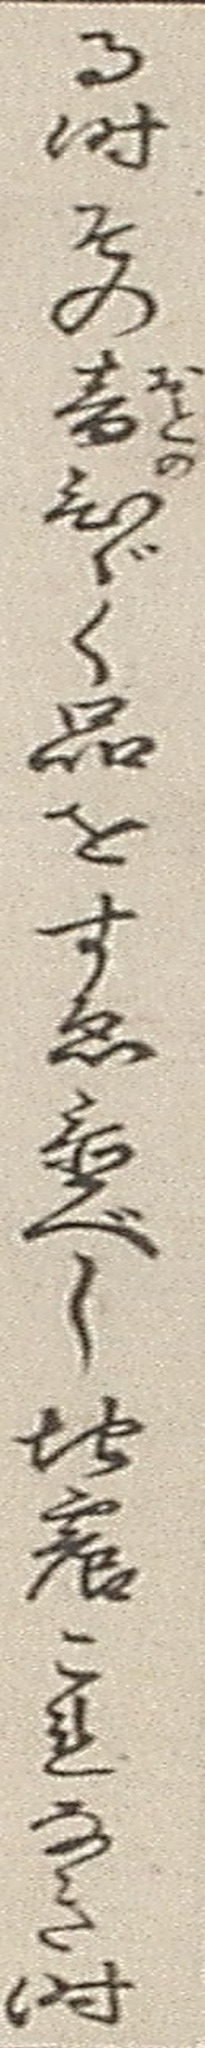る時その音ひゞく品をすゑ置べし地震これなき時
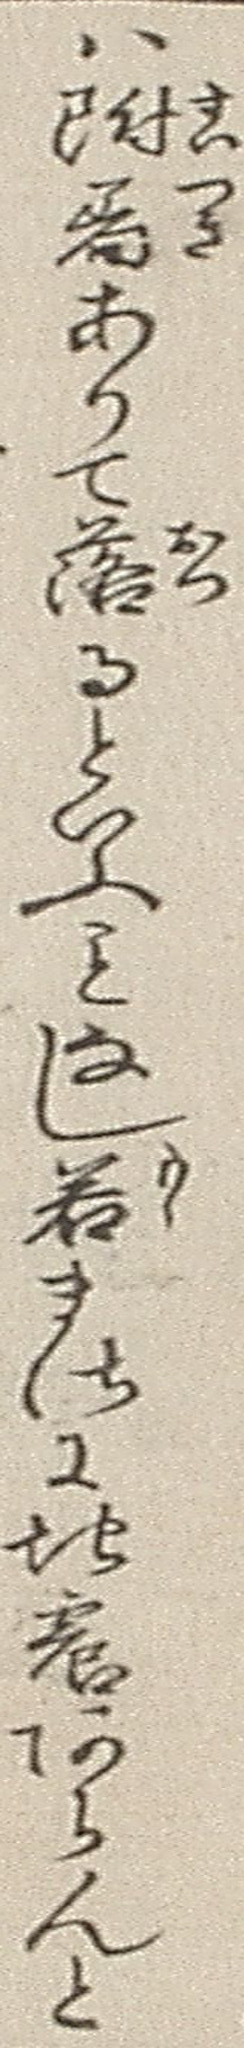は附着ありて落るといふことなし若まさに地震あらんと
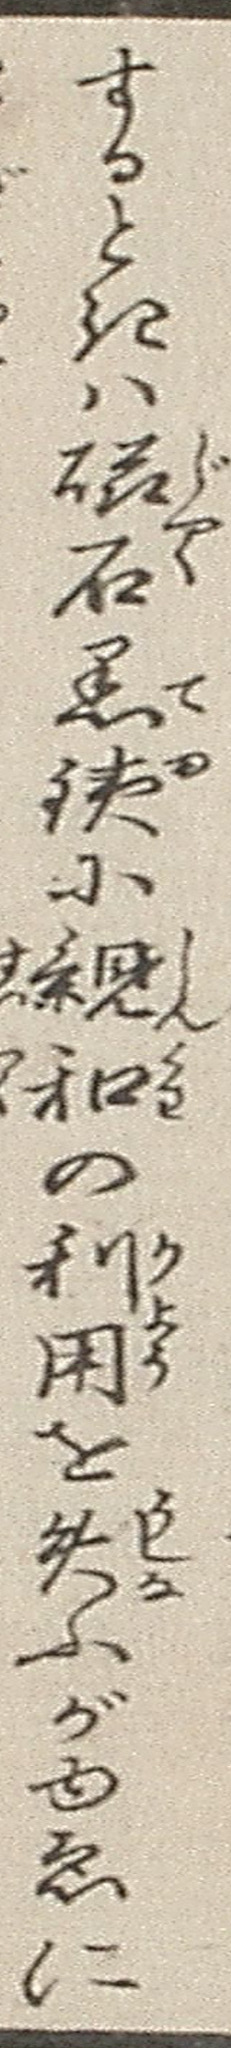するときは磁石黒鉄に親和の利用を失ふがゆゑに
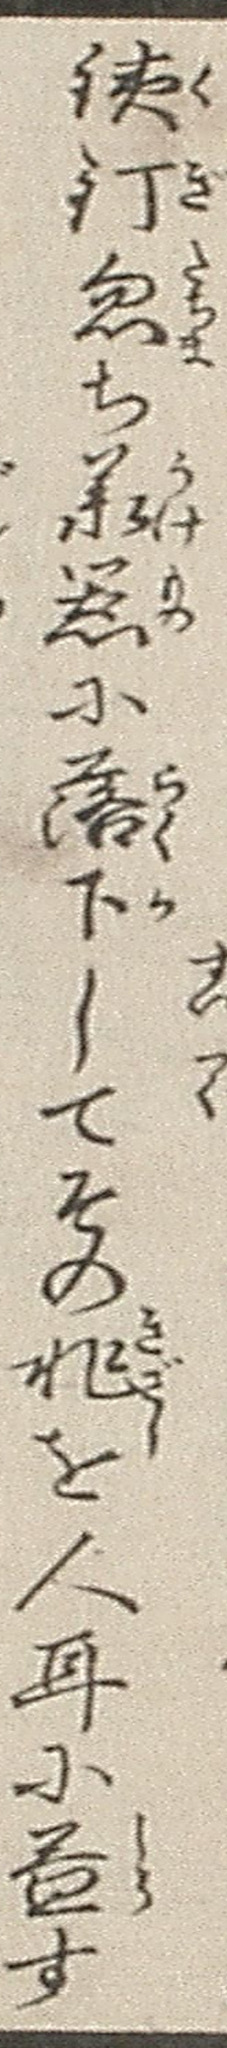鉄釘忽ち承器に落下してその兆を人耳に益す
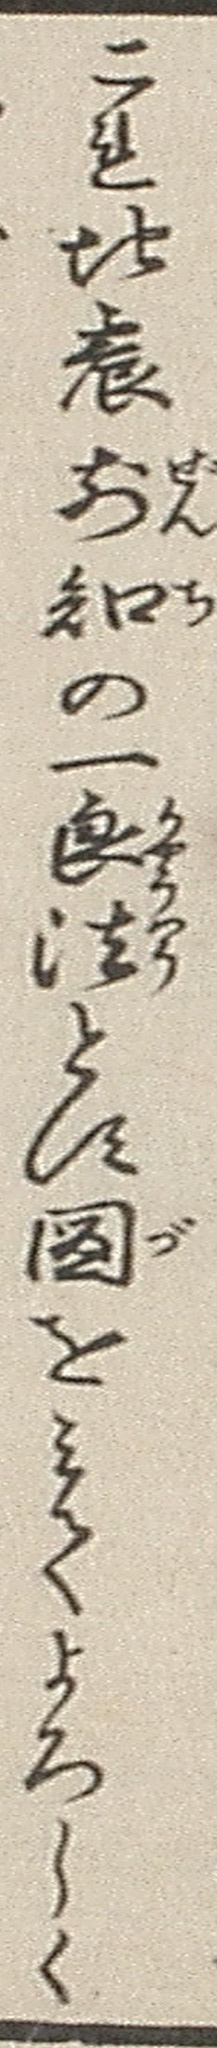これ地震前知の一良法とす図をみてよろしく
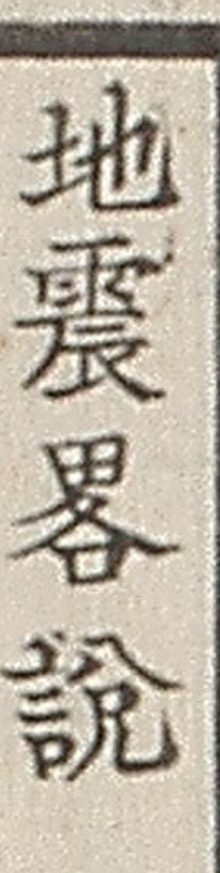地震略説
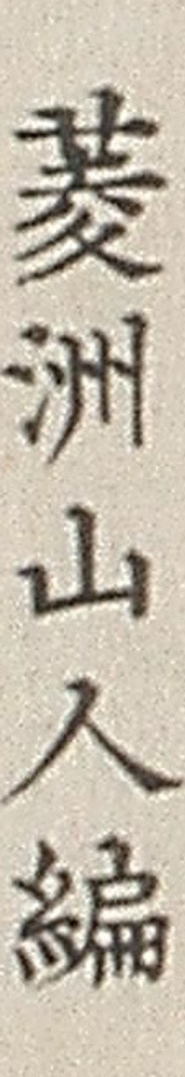菱洲山人編
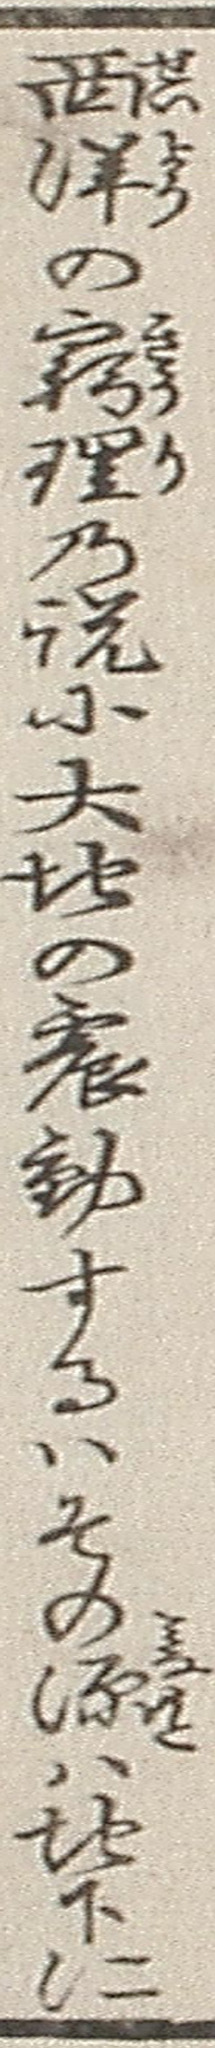西洋の窮理の説に大地の振動するはその源は地下に
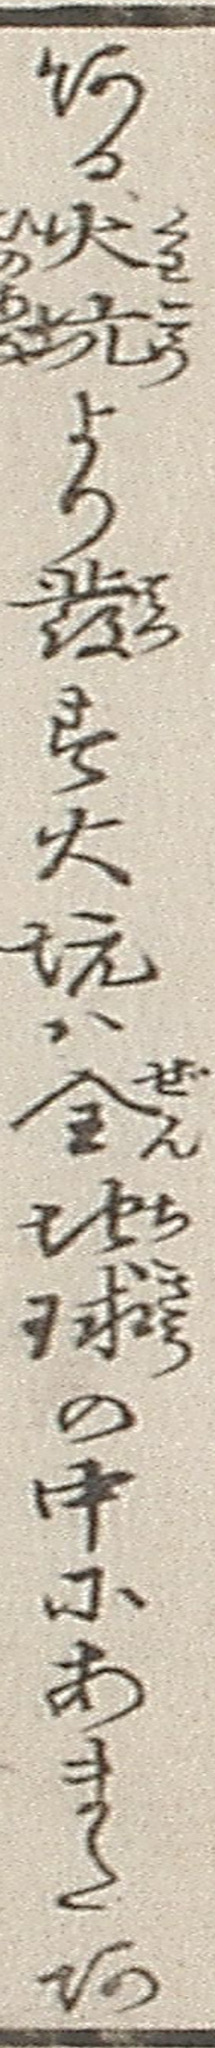ある火坑より発す火坑は全地球の中にあまたあ
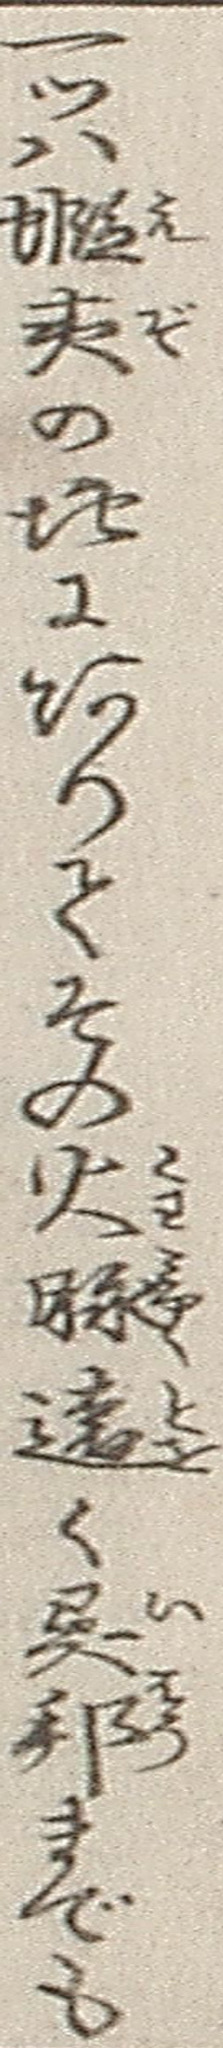一つは蝦夷の地にありてその火脈遠く異邦までも

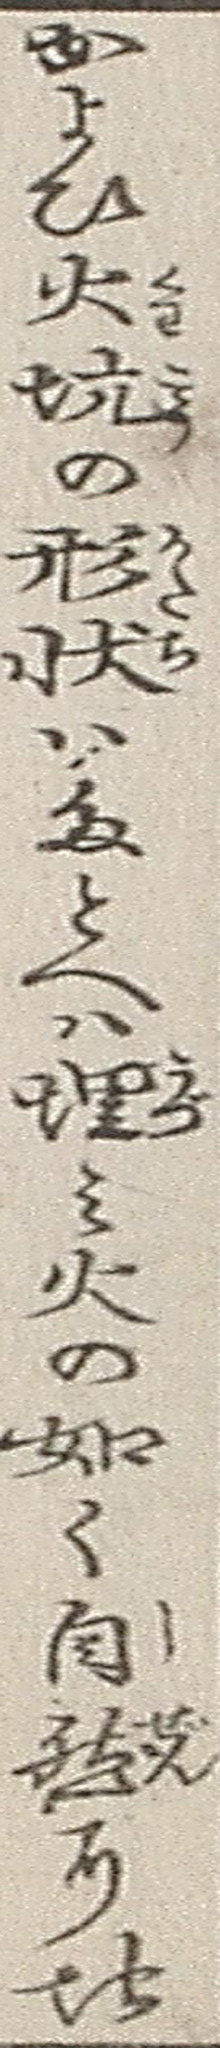かよひ火坑の形状はたとへは埋み火の如く自然に地
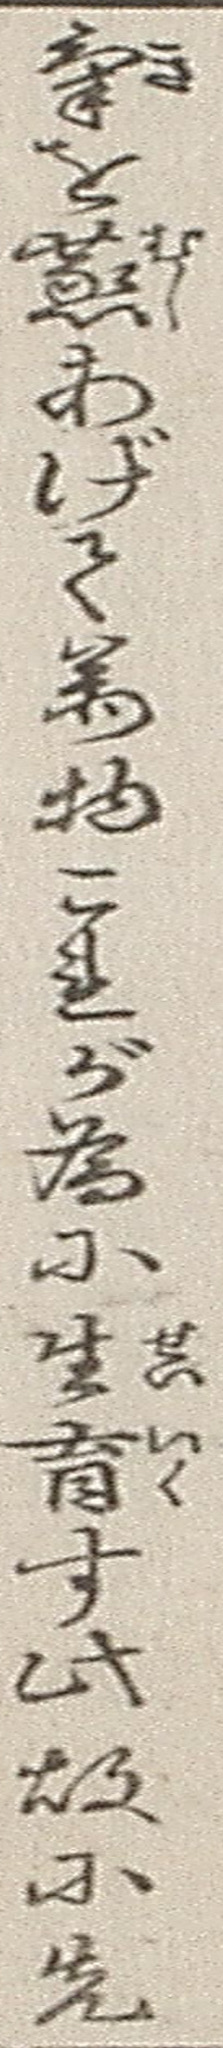気を蒸あげて万物これが為に生育す此故に先
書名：大地震暦年考　全
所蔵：東京大学地震研究所図書室 Earthquake Research Institute Library, The University of Tokyo, JAPAN
